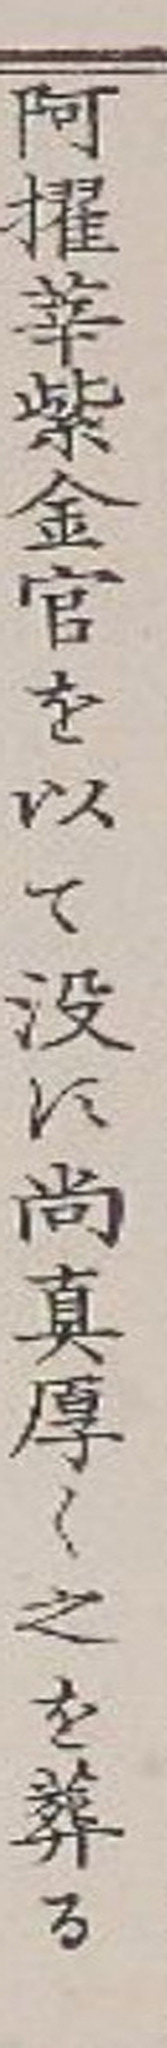阿擢莘紫金官を以て没す尚真厚く之を葬る
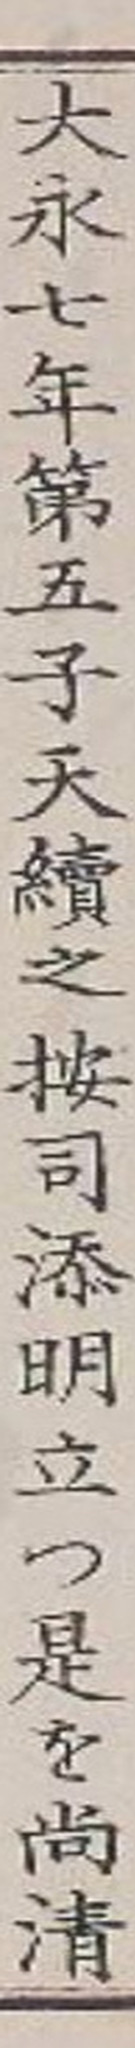大永七年第五子天続之按司添明立つ是を尚清
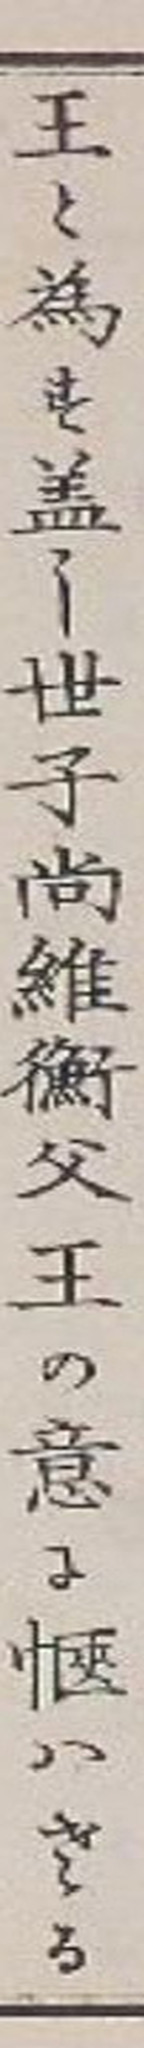王と為す盍し世子尚維衡父王の意にはさる
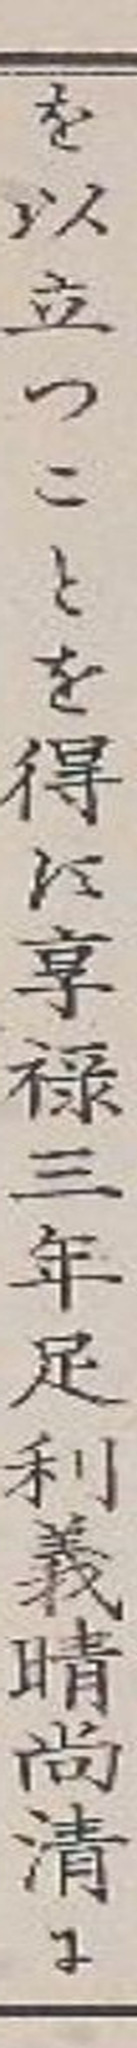を以立つことを得す享禄三年足利義晴尚清に
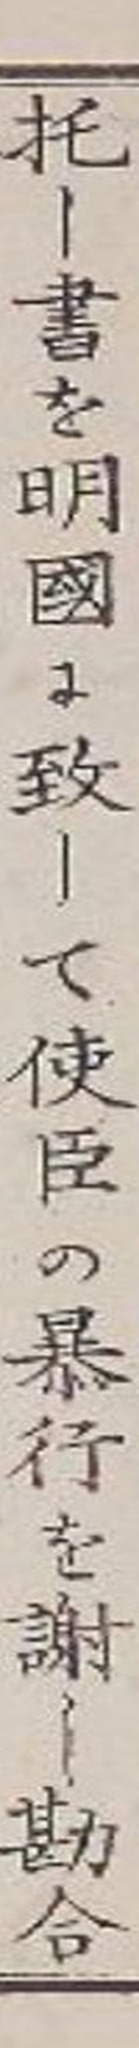託し書を明国に致して使臣の暴行を謝し勘合
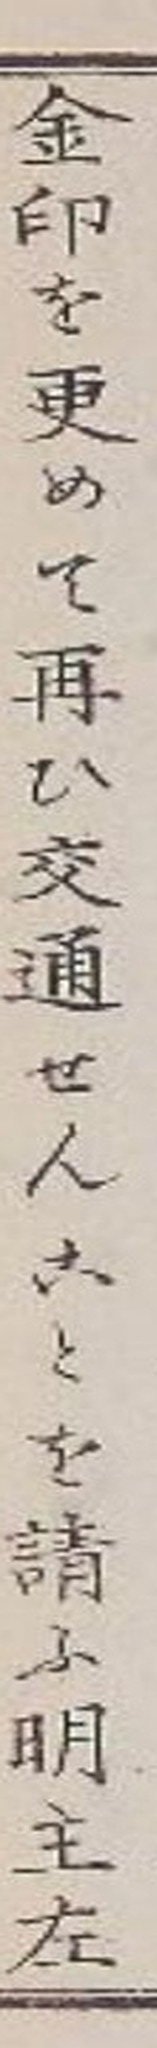金印を更めて再ひ交通せんことを請ふ明主左
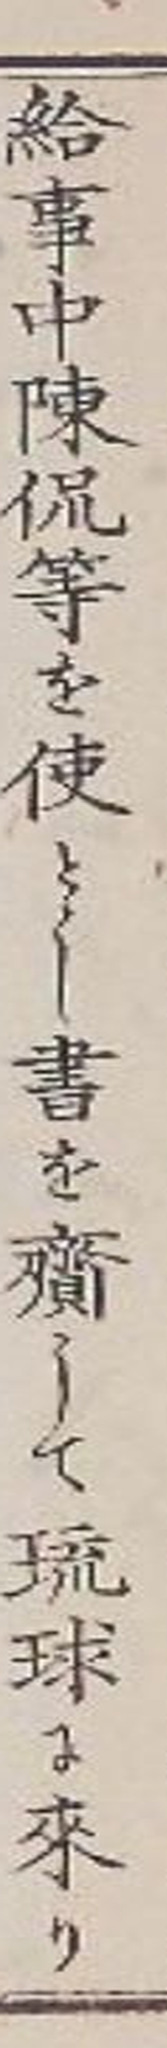給事中陳侃などを使とし書を齎して琉球に来り
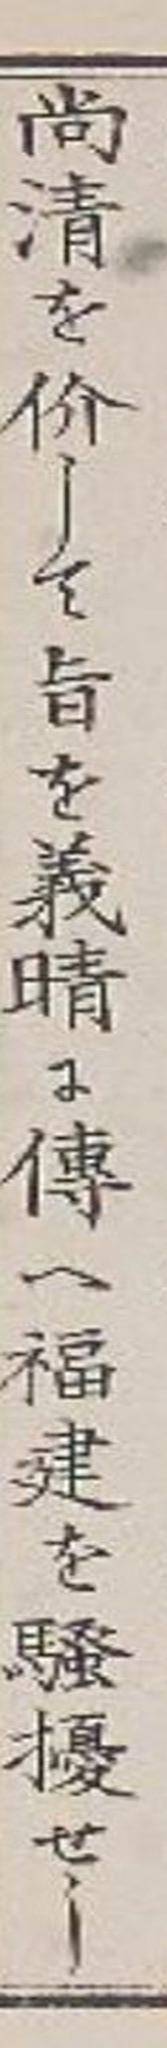尚清を价して旨を義晴に伝へ福建を騒擾せし
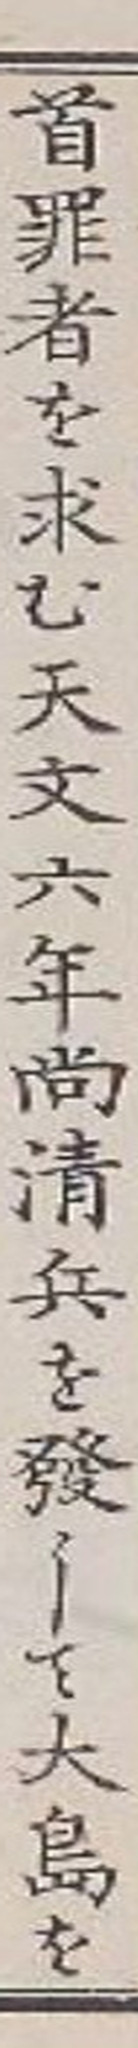首罪者を求天文六年尚清兵を発して大島を
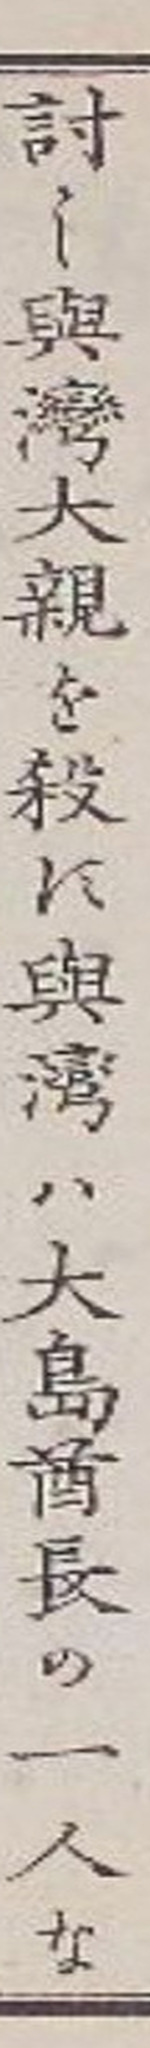討し与湾大親を殺す与湾は大島酋長の一人な
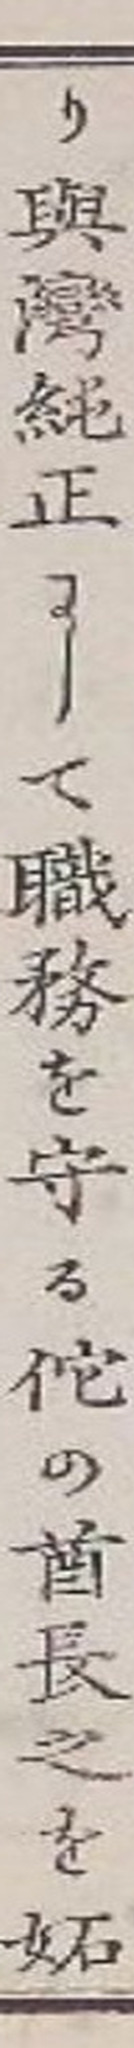り与湾純正にして職務を守る侘の酋長之を妬
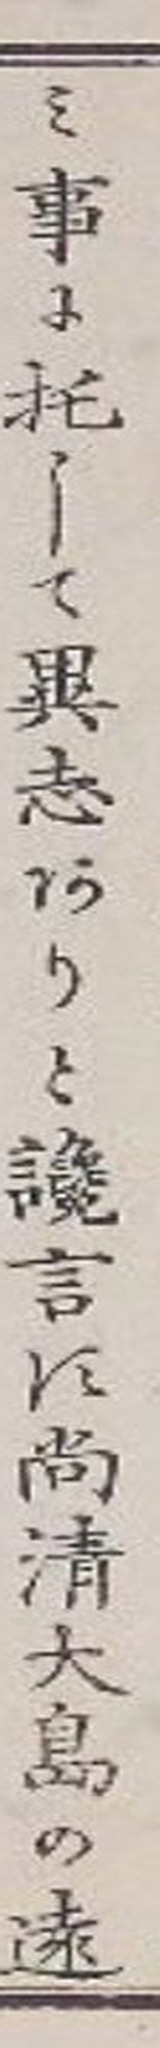み事に托して異志ありと讒言す尚清大島の遠
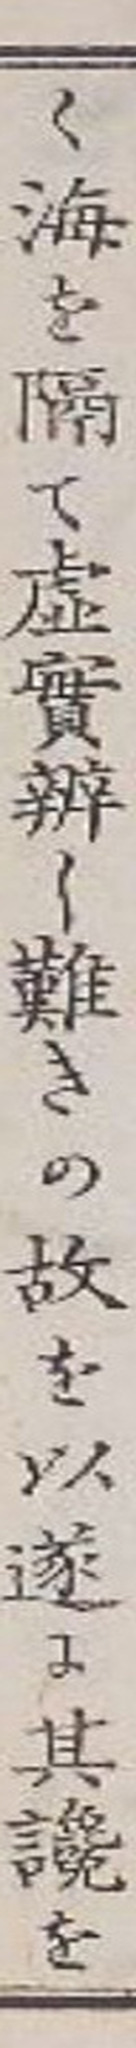く海を隔て虚実弁し難きの故を以遂に其讒を
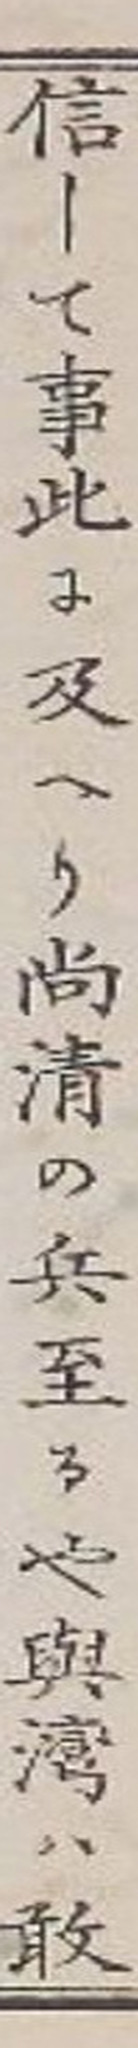信じて事此に及べり尚清の兵至るや与湾は敢
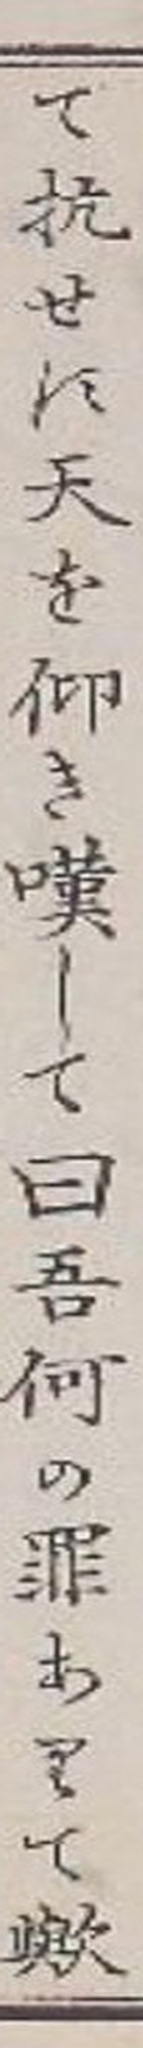て抗せす天を仰き嘆して曰吾何の罪ありて歟
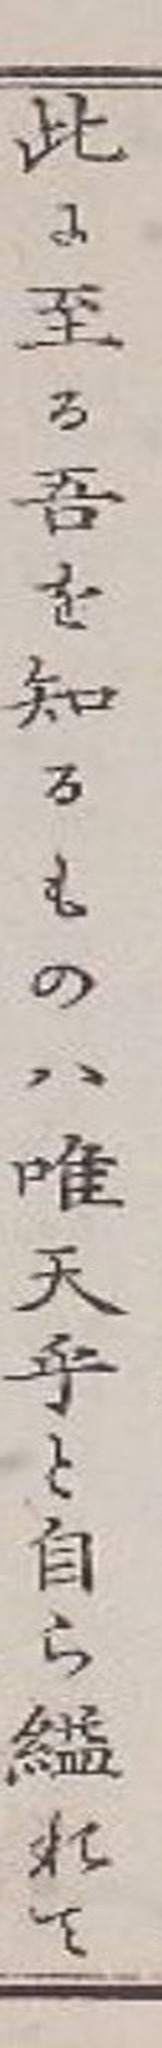此に至る吾を知るものは唯天乎と自ら縊れて
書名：南島紀事 中
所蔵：University of the Ryukyus Library
